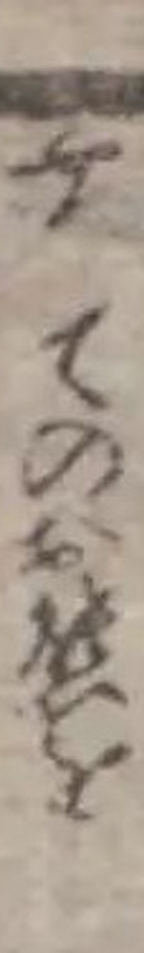やりてのお熊を
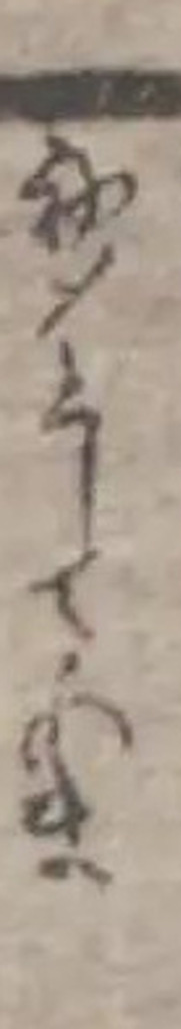初めとしてあま
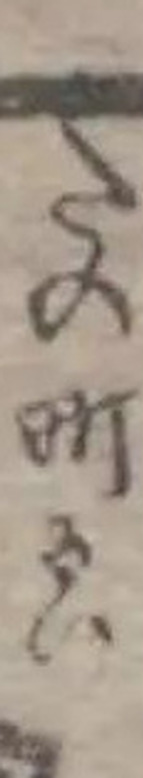たの町るい
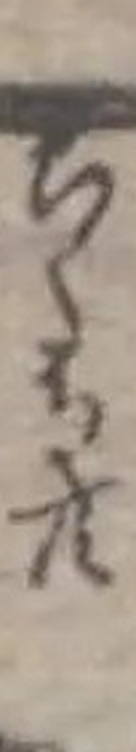ちくは共
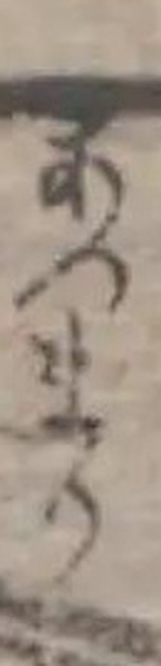あつまり
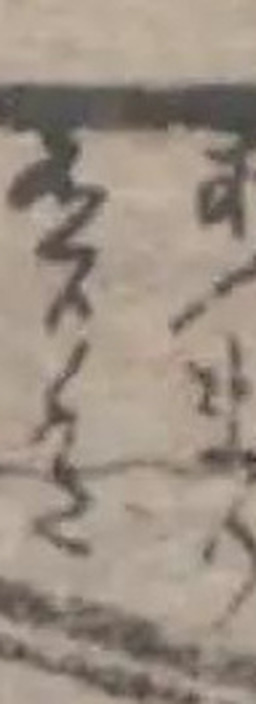有りかた
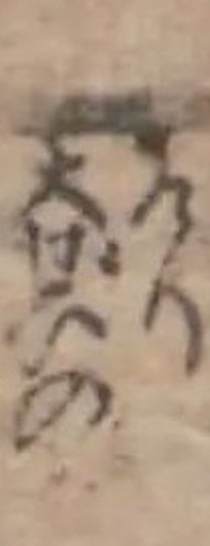大ぜいの
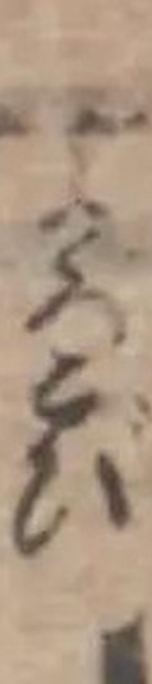よろこび
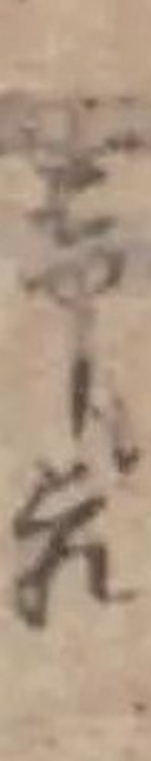はやしこれ
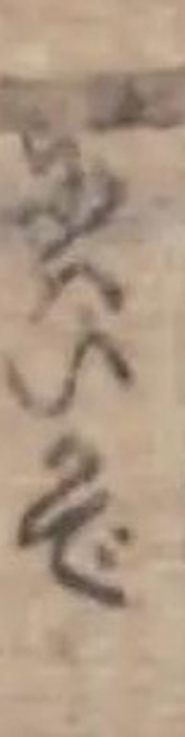にはいかで
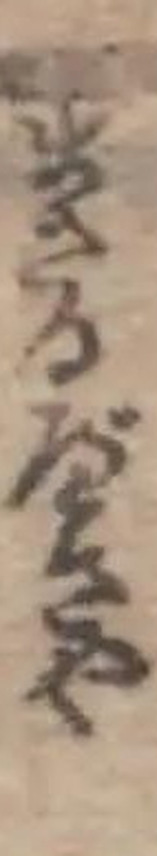まさるべきや
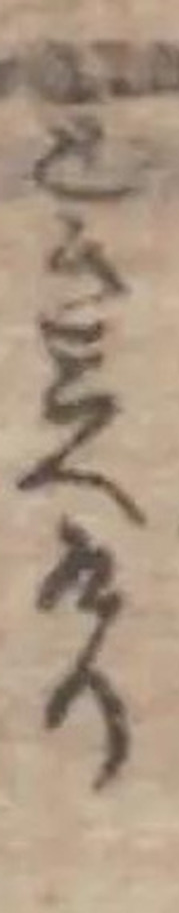ときこへけり
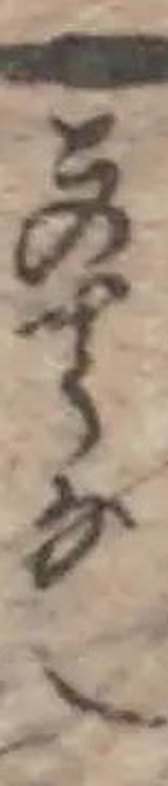このやうな
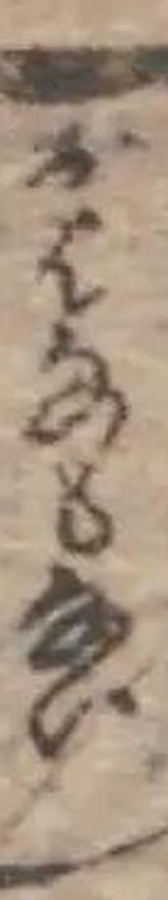おはなもない
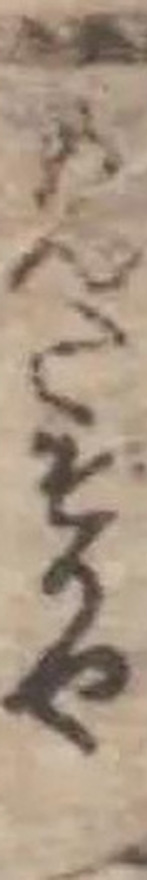もんたそりや
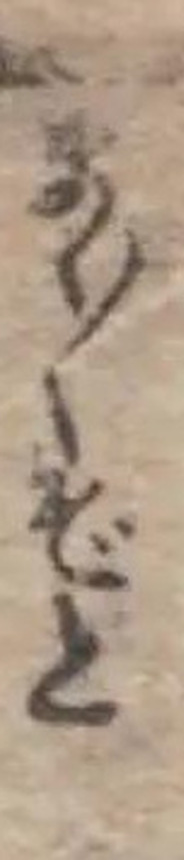まく〳〵ぞと
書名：早出来 3巻
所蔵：国立国会図書館 National Diet Library, JAPAN
